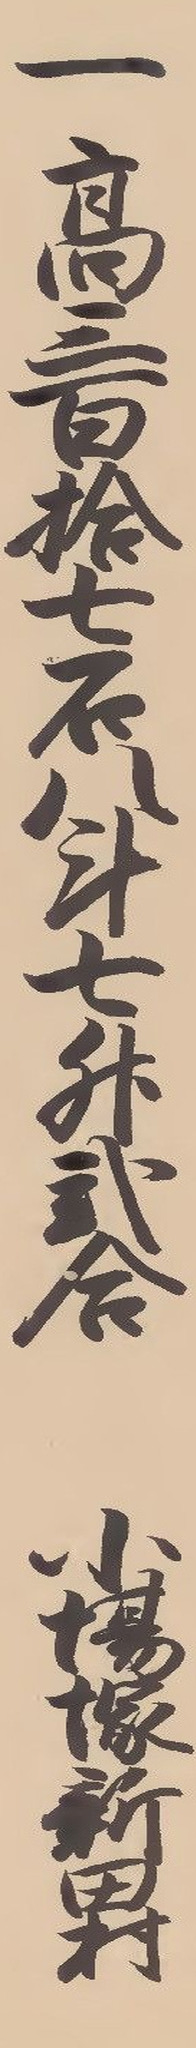一高三百拾七石八斗七升弐合小場塚新田村
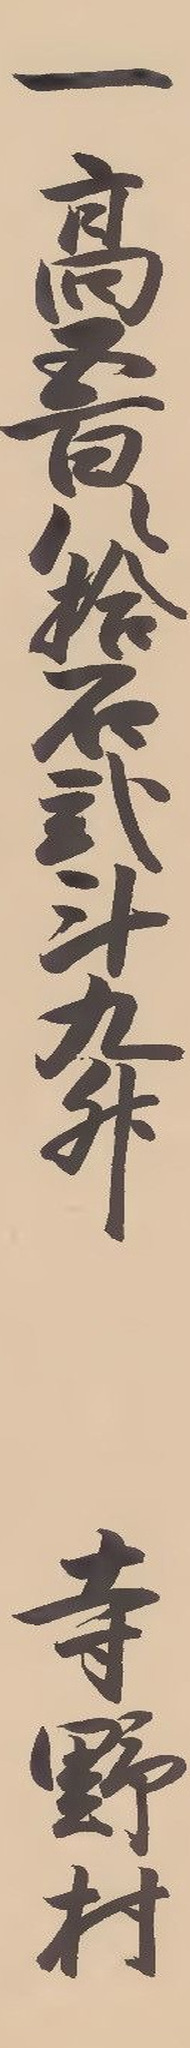一高五百八拾石弐斗九升寺野村
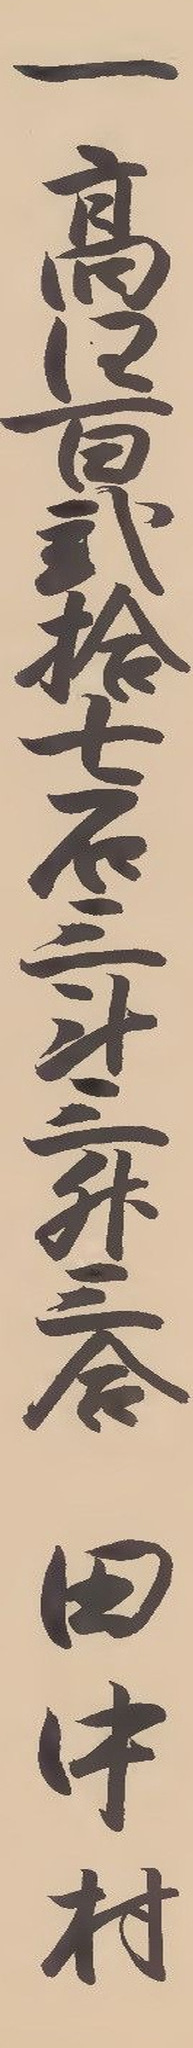一高四百弐拾七石三斗三升三合田中村
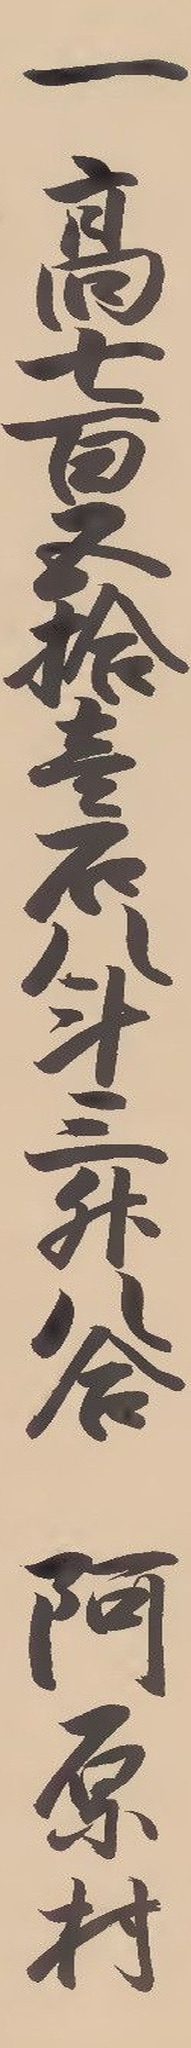一高七百五拾壱石八斗三升八合阿原村
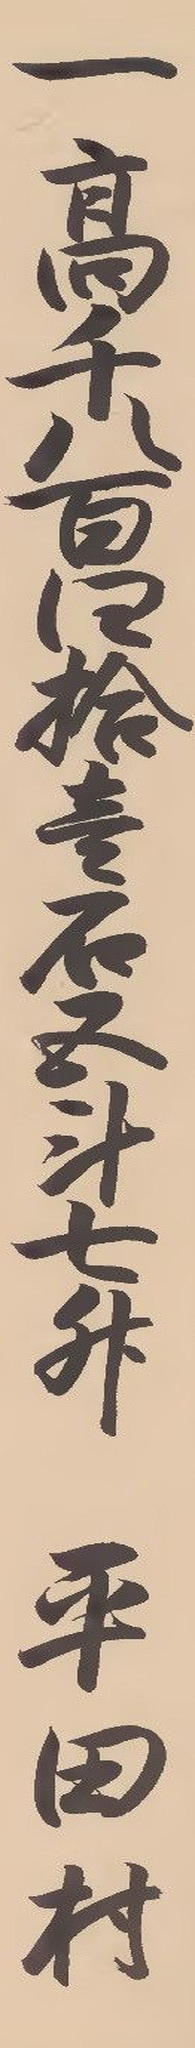一高千八百四拾壱石五斗七升平田村
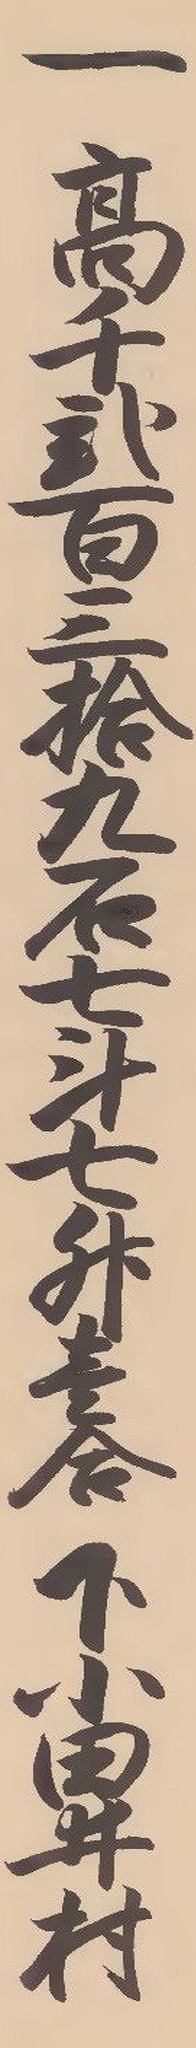一高千弐百三拾九石七斗七升壱合下小田井村
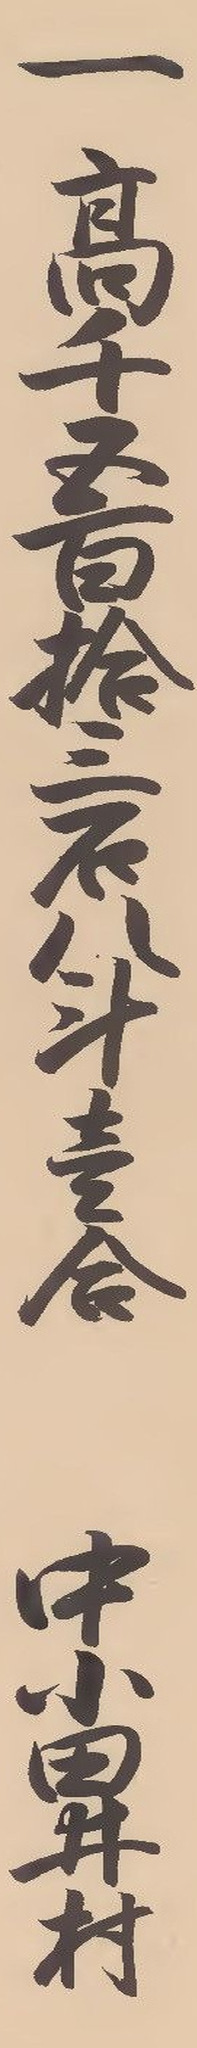一高千五百拾三石八斗壱合中小田井村
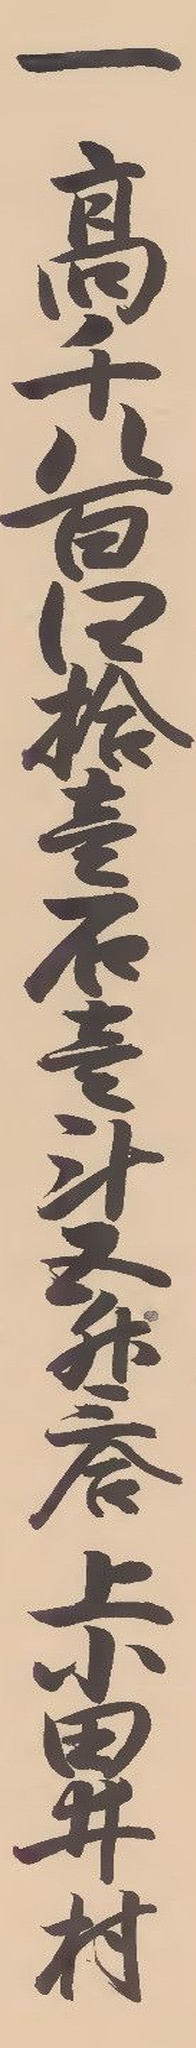一高千八百四拾壱石壱斗五升三合上小田井村

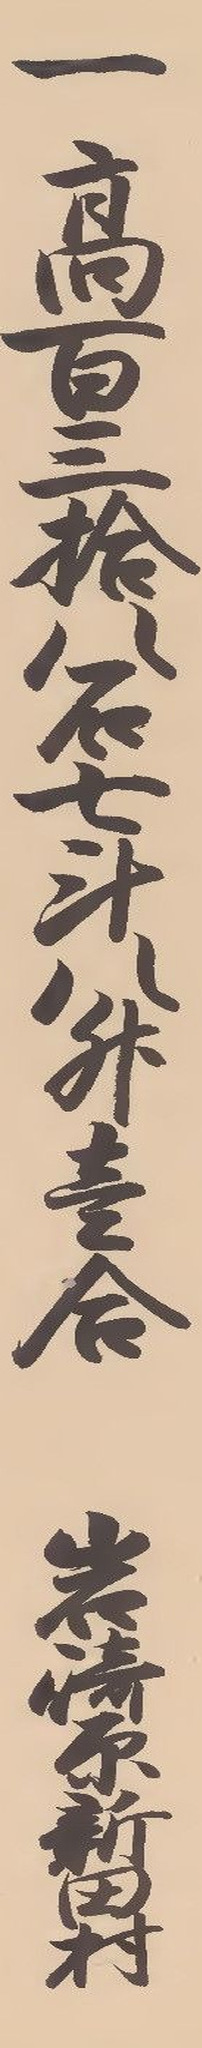一高百三拾八石七斗八升壱合岩崎原新田村
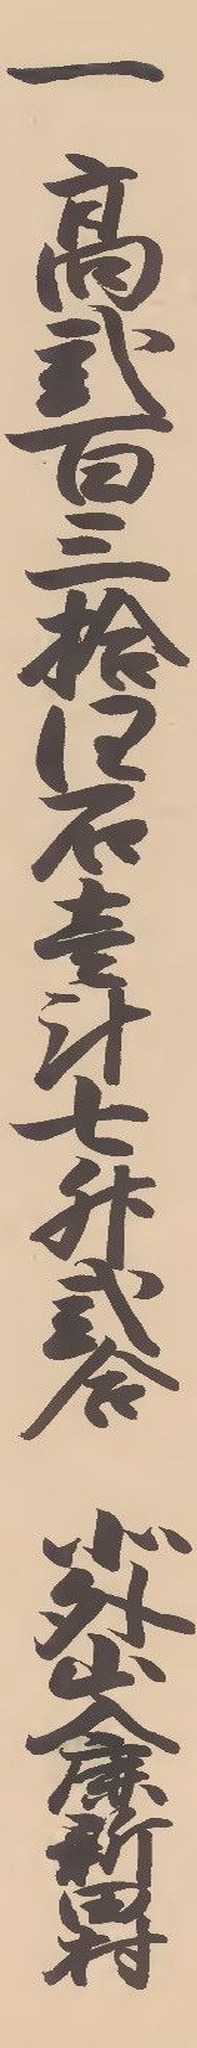一高弐百三拾四石壱斗七升弐合北外山入鹿新田村
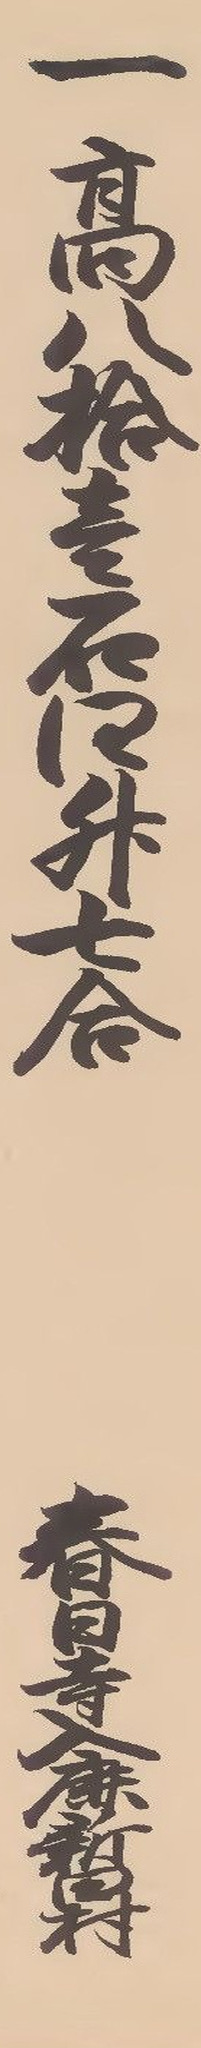一高八拾壱石四升七合春日寺入鹿新田村
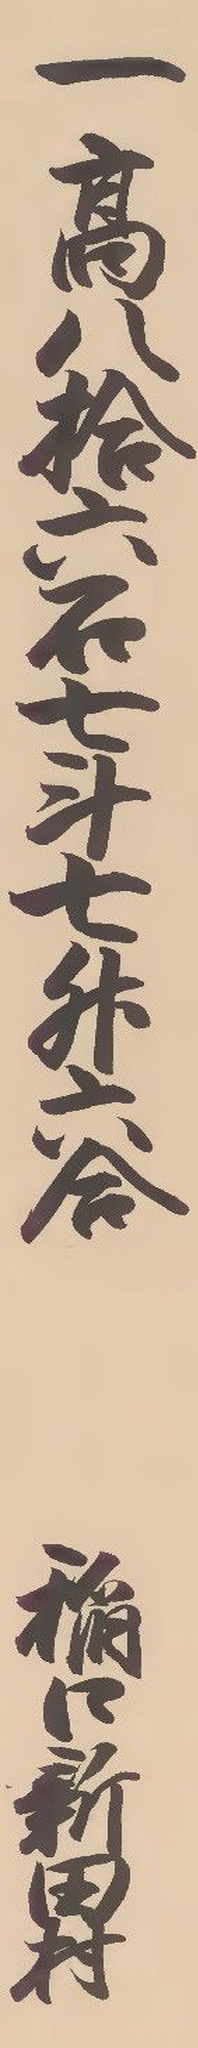一高八拾六石七斗七升六合稲口新田村
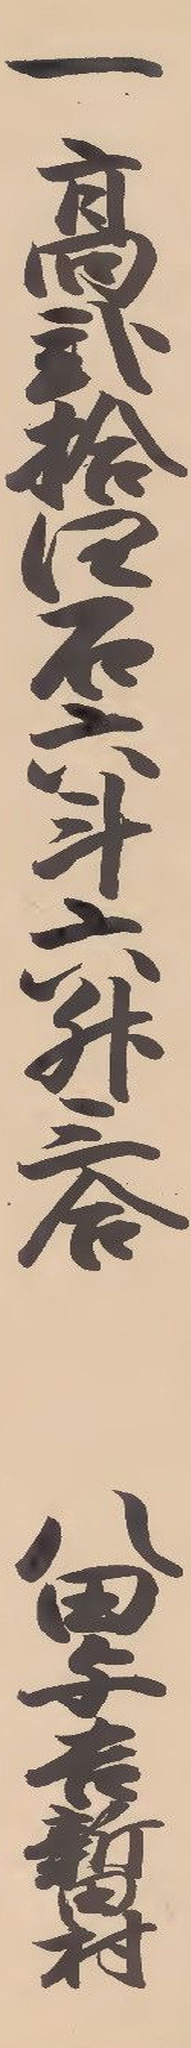一高弐拾四石六斗六升三合八田与吉新田村
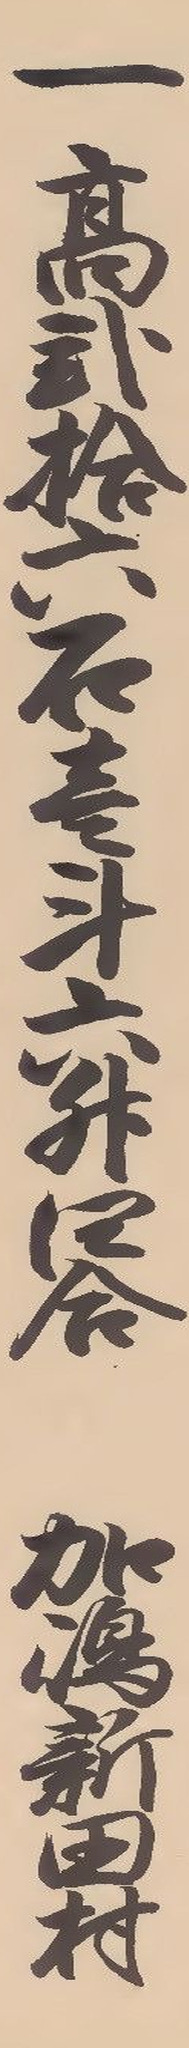一高弐拾六石壱斗六升四合加島新田村
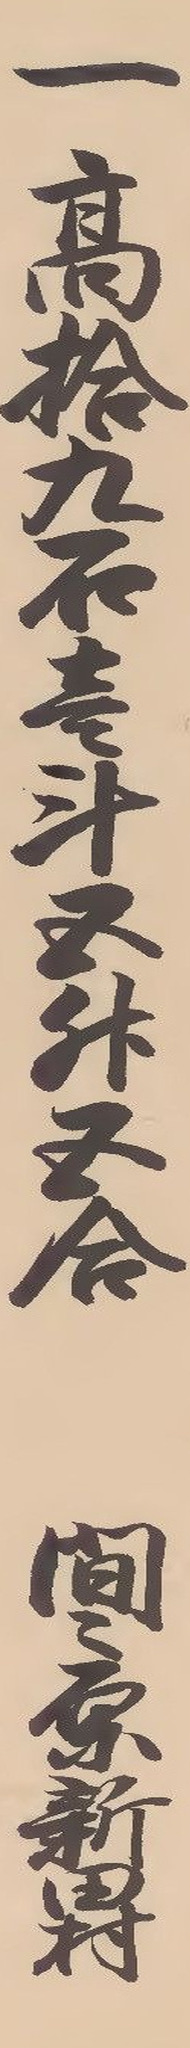一高拾九石壱斗五升五合間々原新田村
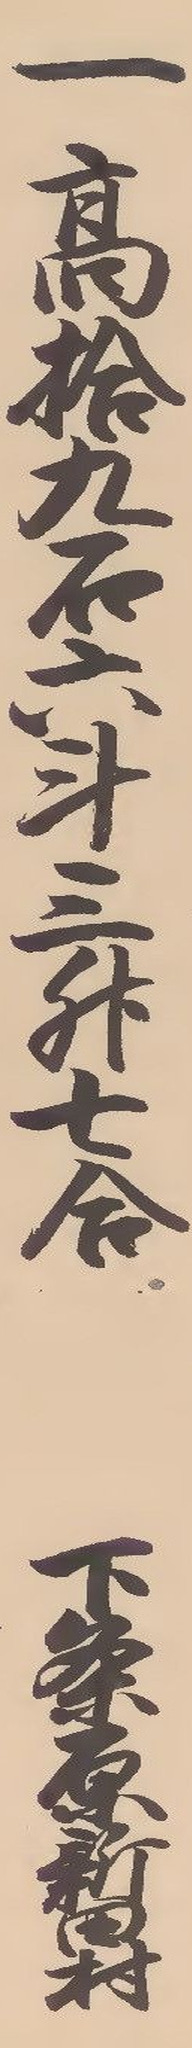一高拾九石六斗三升七合下条原新田村
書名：尾張国郷帳
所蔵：国立公文書館 National Archives of Japan
